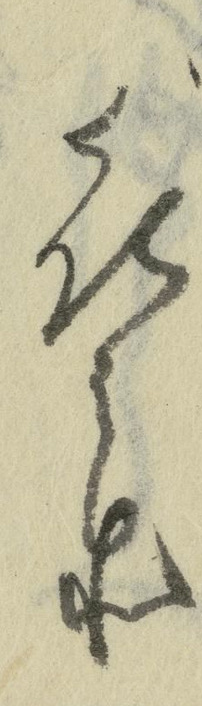嘉兵衛
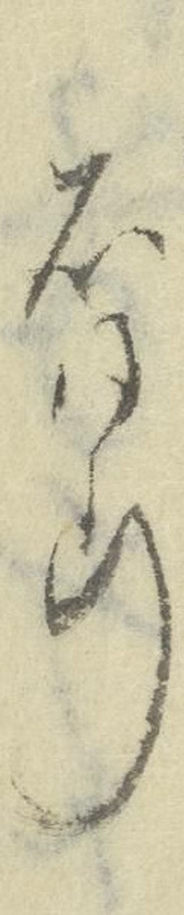右同断
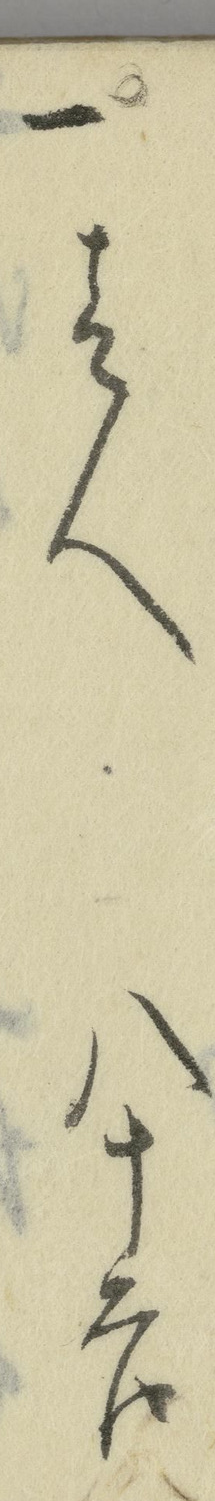○一壱人八十吉
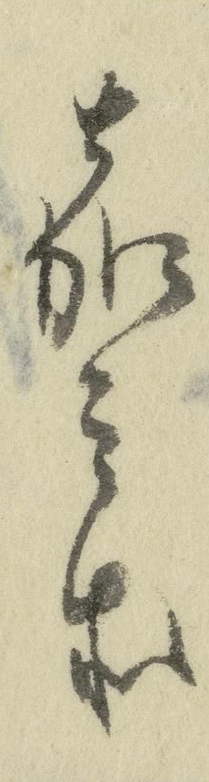嘉兵衛
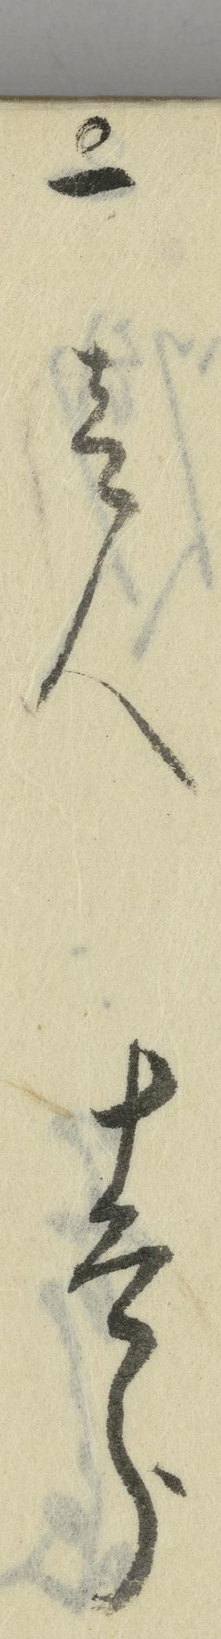○一壱人十太郎
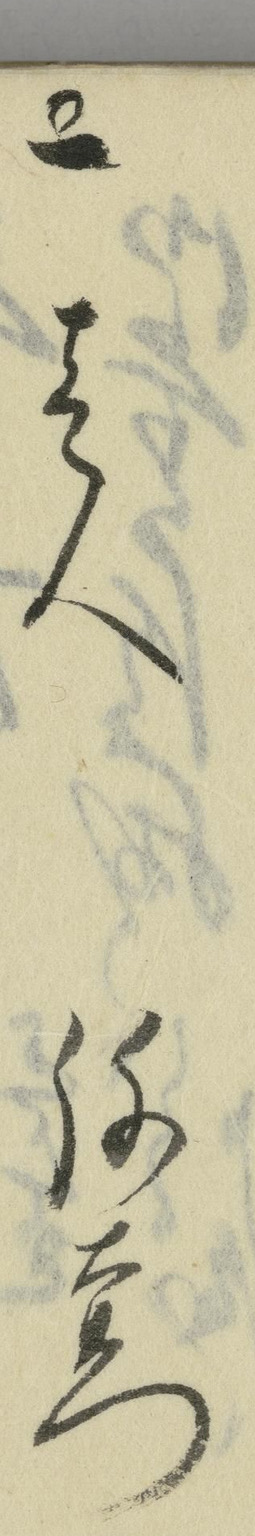○一壱人弥右衛門

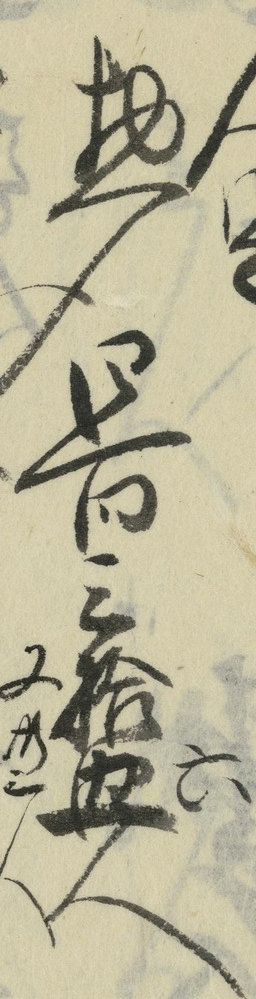惣〆四百三拾六人
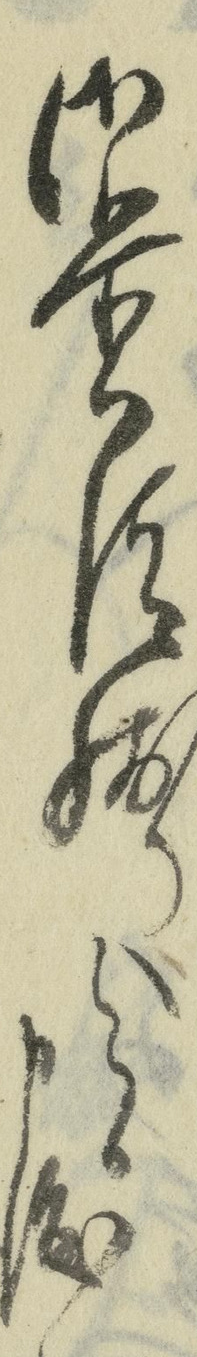御普請残り今日
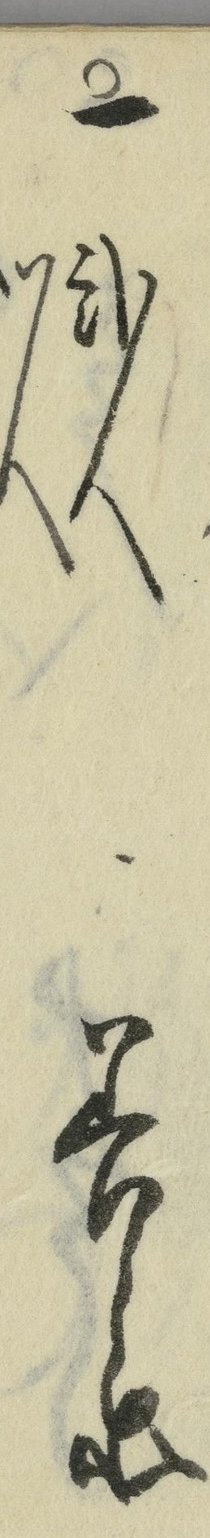○一弐人善兵衛
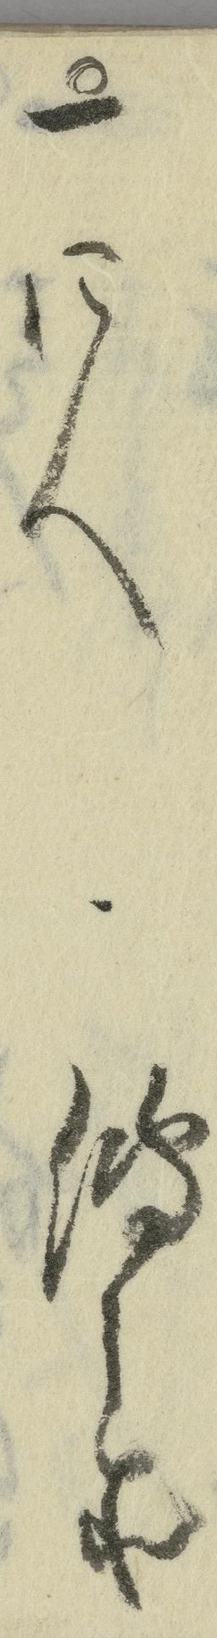○一四人伝兵衛
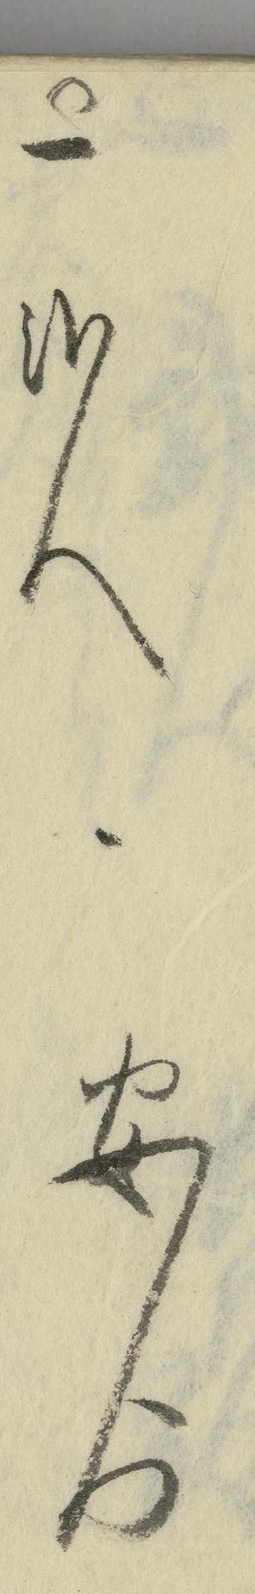○一弐人安右衛門
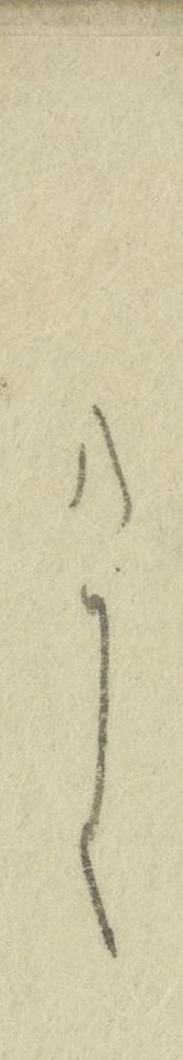八十文

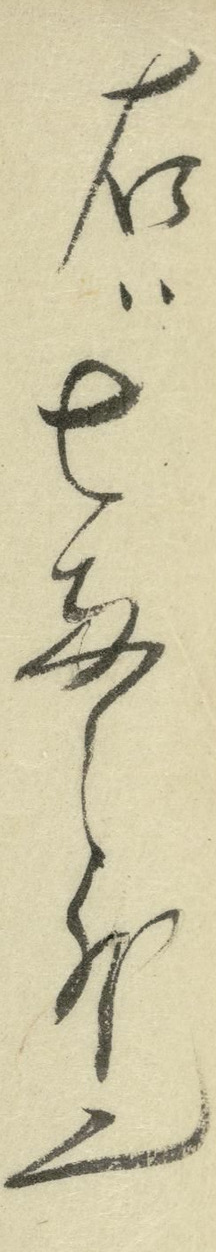右ハ七両之外也

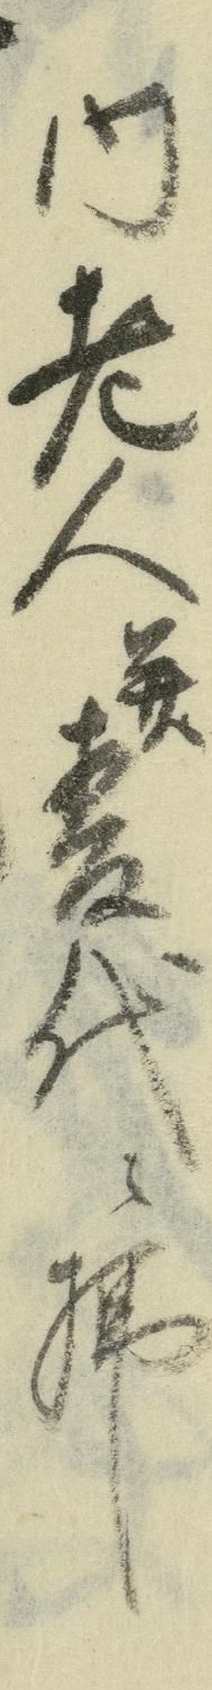内老人并麦代二払
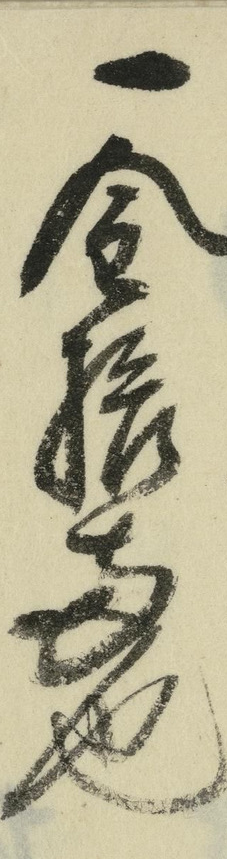一金拾両也
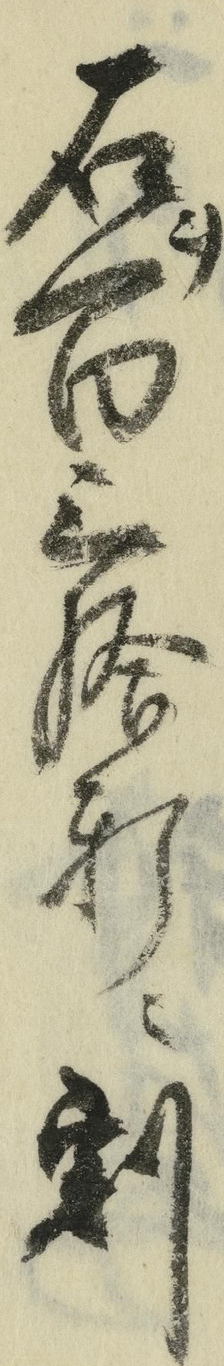右ヲ百三拾軒二割
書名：天明淺間噴火ニ関スル書類
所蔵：東京大学地震研究所図書室 Earthquake Research Institute Library, The University of Tokyo, JAPAN
